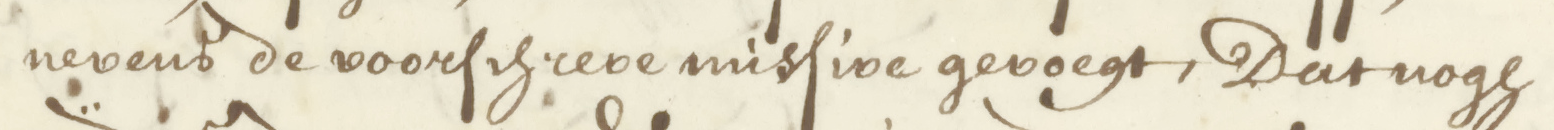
nevens de voorschreve missive gevoegt, Dat nogh
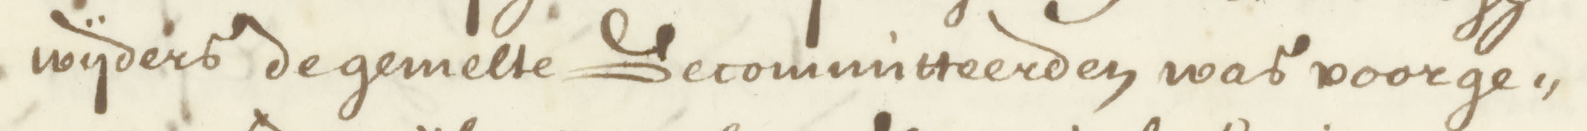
wijders de gemelte Gecommitteerden was voorge„
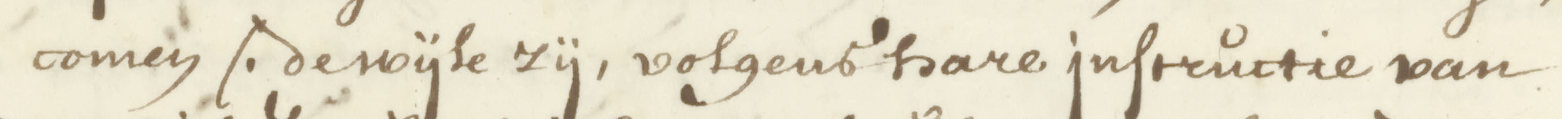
comen (.de wijle zij, volgens hare instructie van
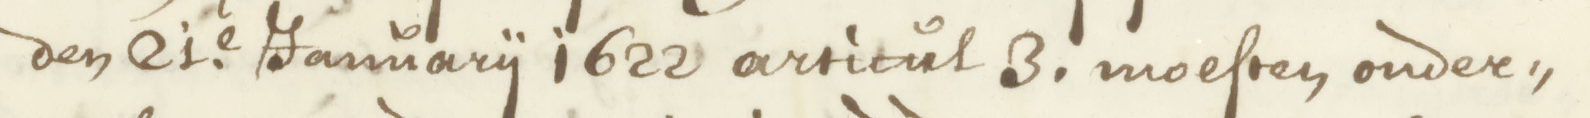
den 21e. Januarij 1622 articul 3. moesten onder„
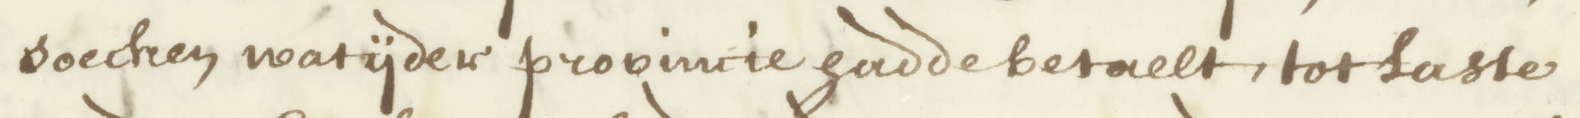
soecken wat ijder provincie hadde betaelt, tot laste
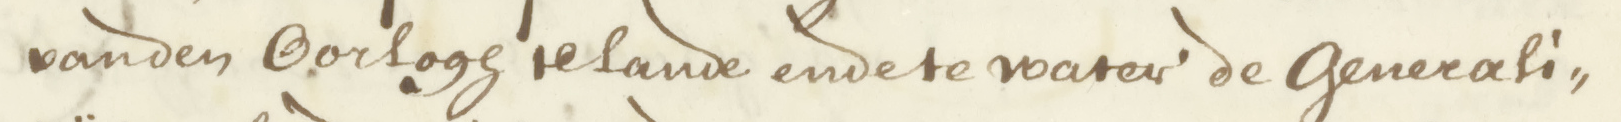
vanden Oorlogh te lande ende te water de Generali„
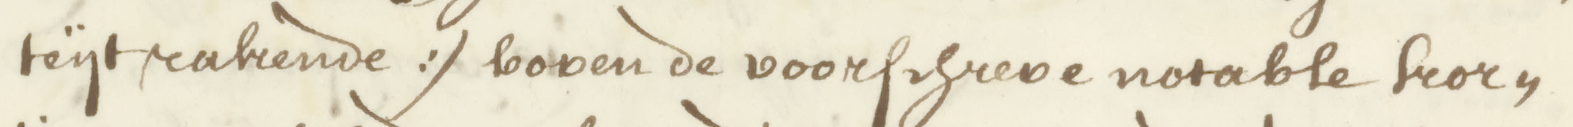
teijt rakende:) boven de voorschreve notable kor„
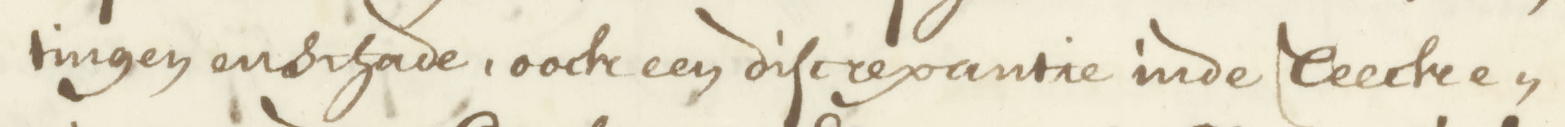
tingen en schade, oock een discrepantie inde Reecke„
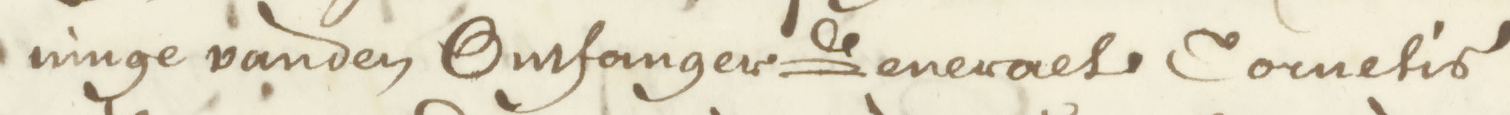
ninge vanden Ontfanger Generael Cornelis
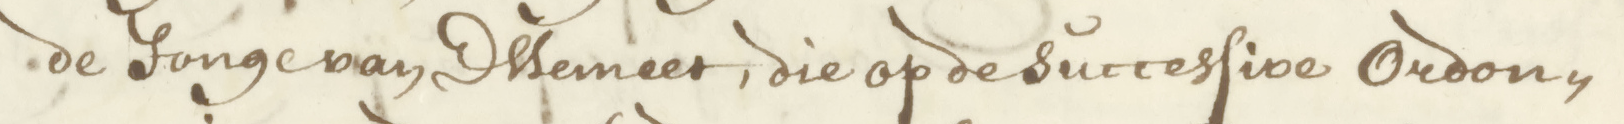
de Jonge van Ellemeet, die op de successive Ordon„
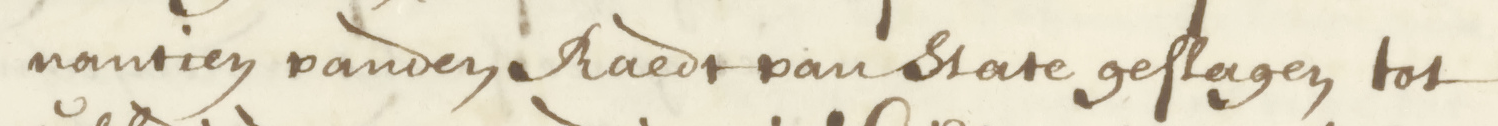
nantien vanden Raedt van State geslagen tot
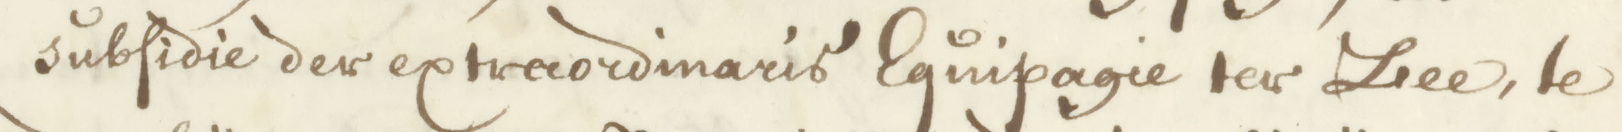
subsidie der extraordinaris Equipagie ter Zee, te
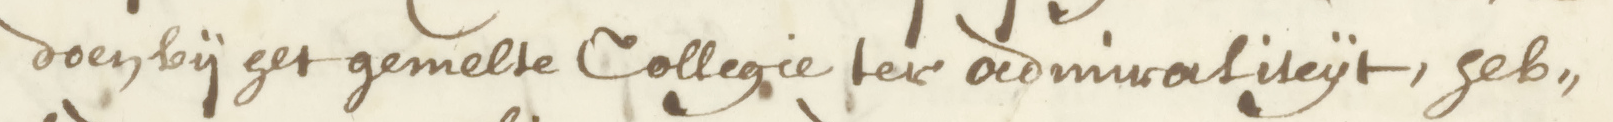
doen bij het gemelte Collegie ter admiraliteijt, heb„
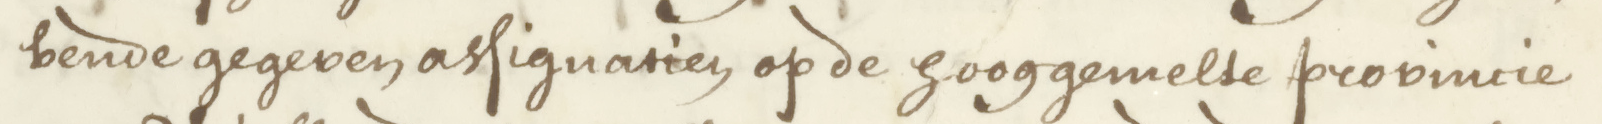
bende gegeven assignatien op de hooggemelte provincie
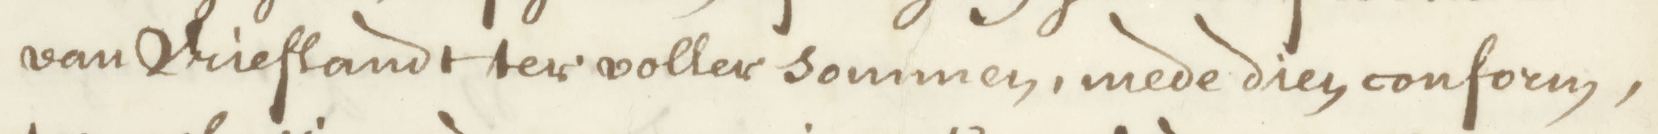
van Vrieslandt ter voller sommen, mede dien conform,
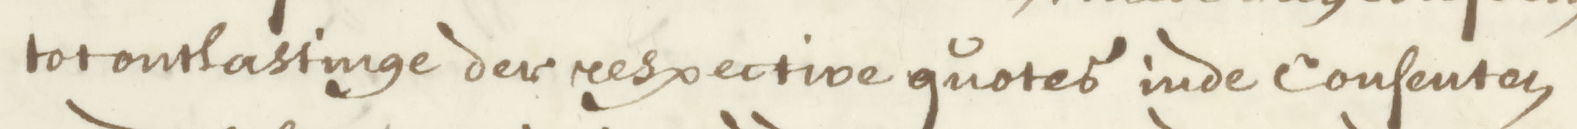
tot ontlastinge der respective quotes inde consenten
